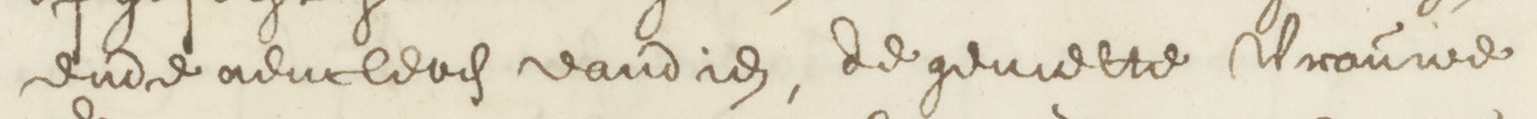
ende aencleven vandien, de gemelte Vrouwe
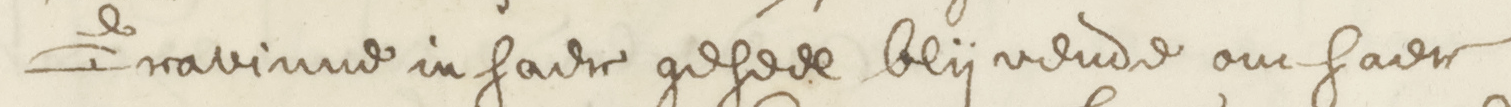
Gravinne in haer geheel blijvende om haer
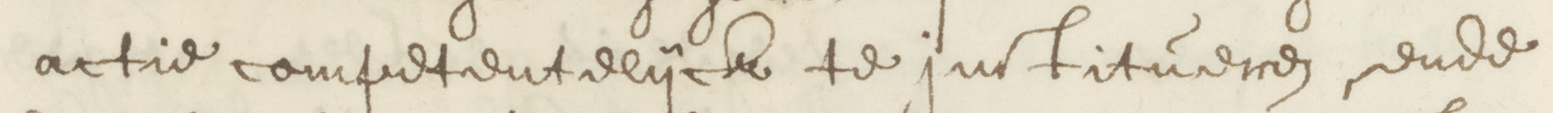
actie competentelijck te justitueren, ende
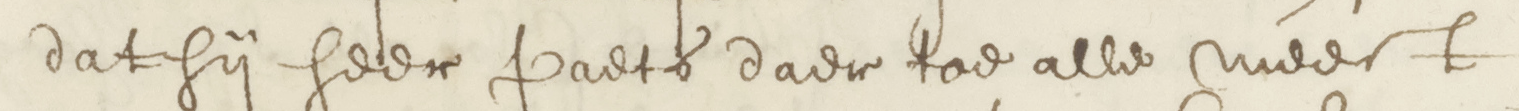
dat hij heer Paets daer toe alle meest
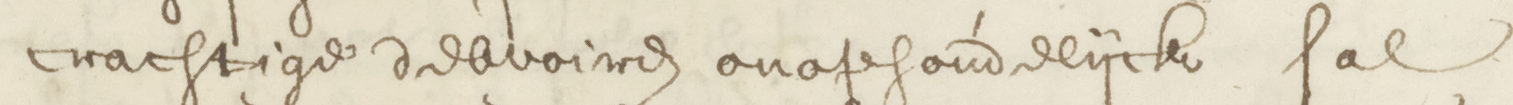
crachtige debvoiren onophoudelijck sal
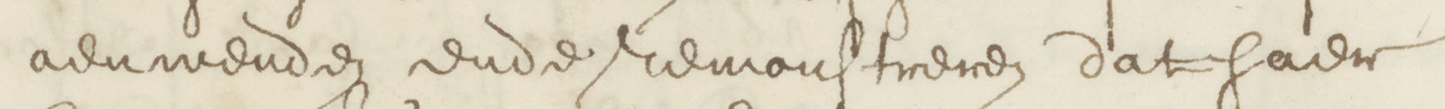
aenwenden ende remonstreren dat haer
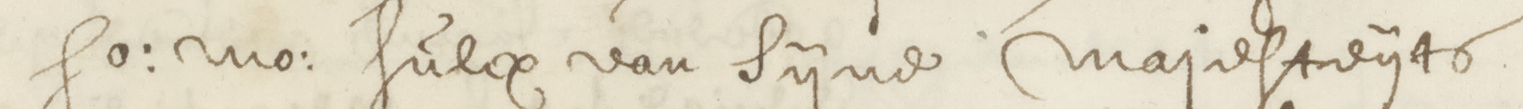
Ho:Mo: sulcx van Sijne Majesteijts
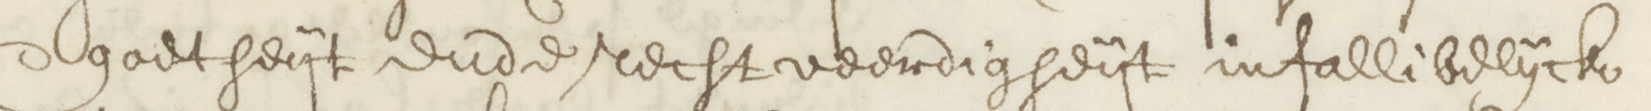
goetheijt ende rechtveerdigheijt infallibelijck
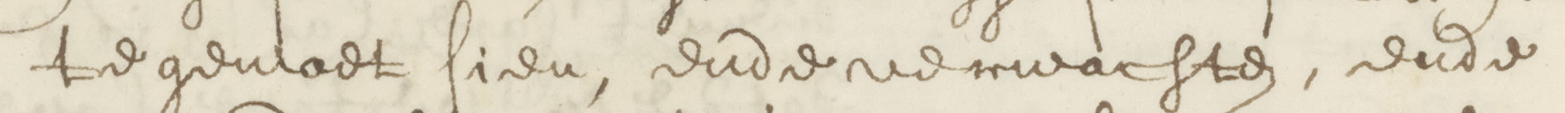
te gemoet sien, ende verwachten, ende
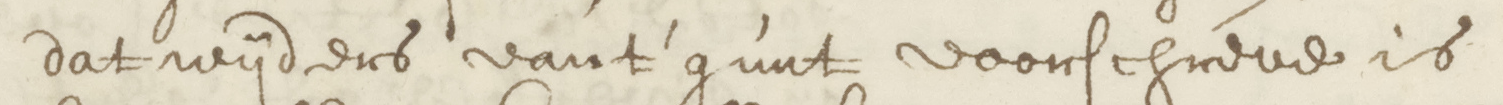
dat wijders vant' gunt voorschreve is
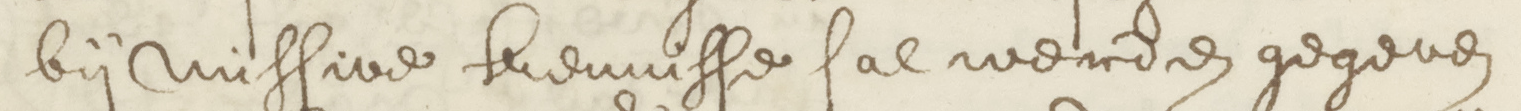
bij missive kennisse sal werden gegeven
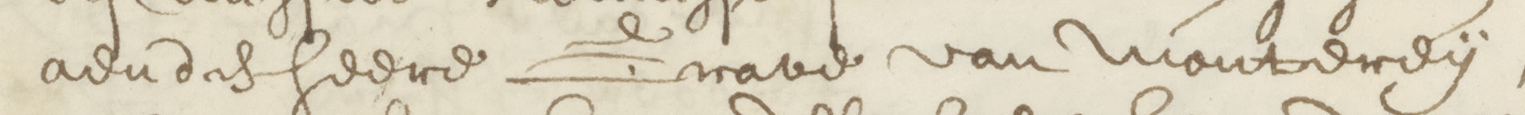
aen den heere Grave van Montereij
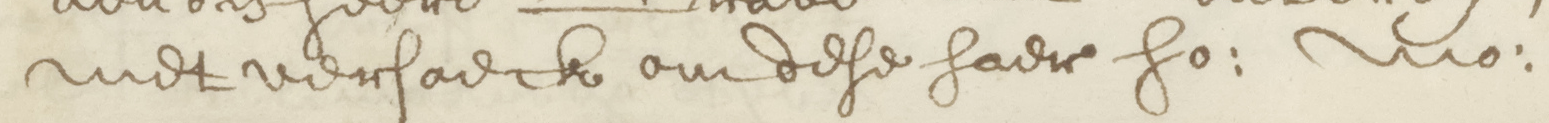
met versoeck om dese haer Ho:Mo:
